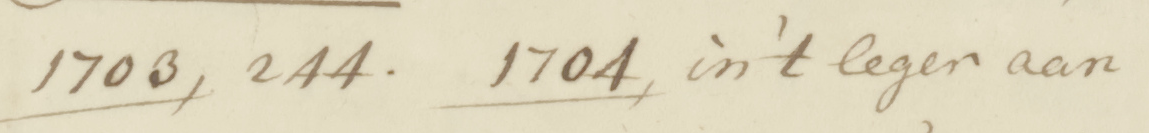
1703, 244. 1704, in 't leger aan
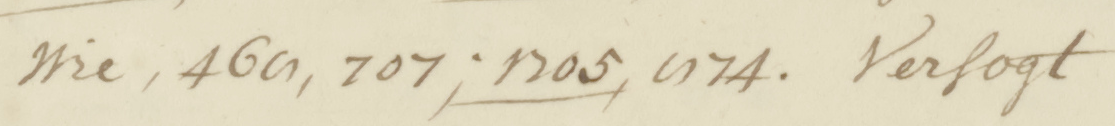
wie, 468, 707; 1705, 874. Versogt
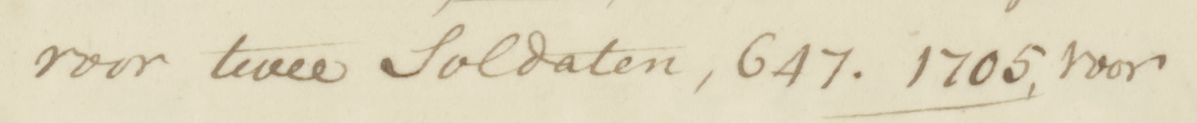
voor twee soldaten, 647, 1705, voor
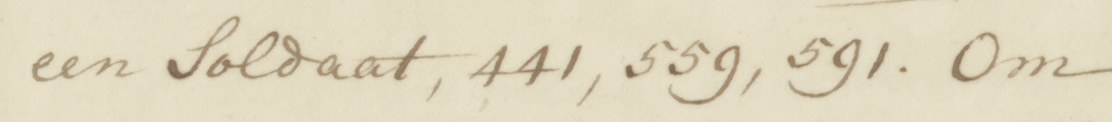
een soldaat, 441, 559, 591. Om
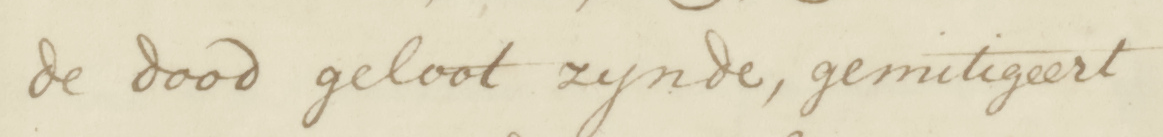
de dood geloot zijnde, gemitigeert
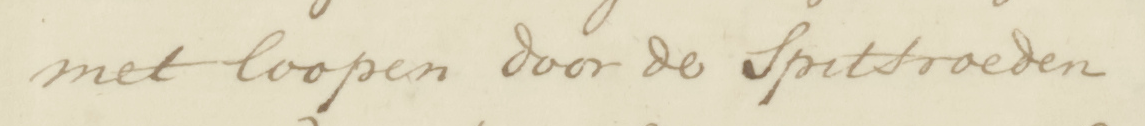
met loopen door de spitsroeden
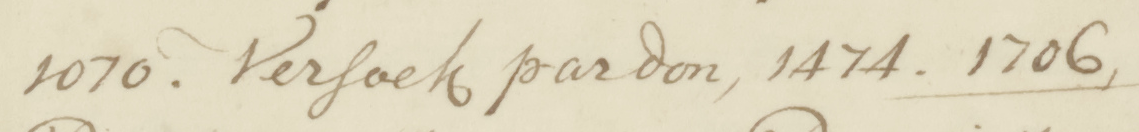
1070. Versoek pardon, 1474, 1706.
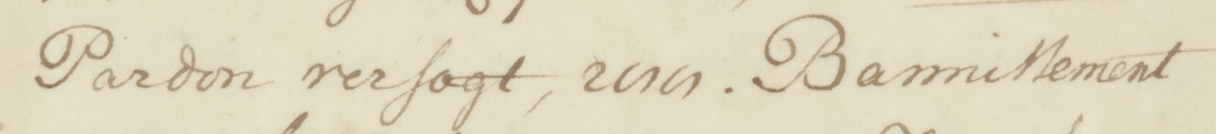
Pardon versogt, 288. Bannissement
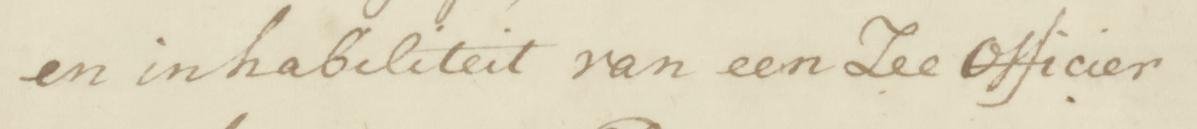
en inhabiliteit van een Zee Officier
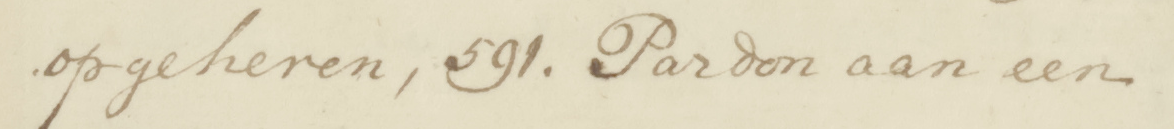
opgeheven, 591. Pardon aan een
